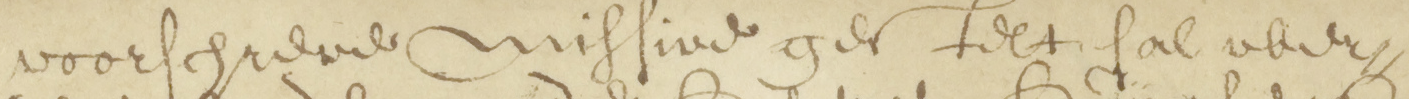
voorschreve Missive gestelt sal wer„
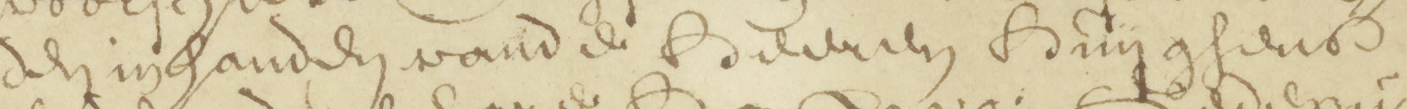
den inhanden vande Heeren Huijghens
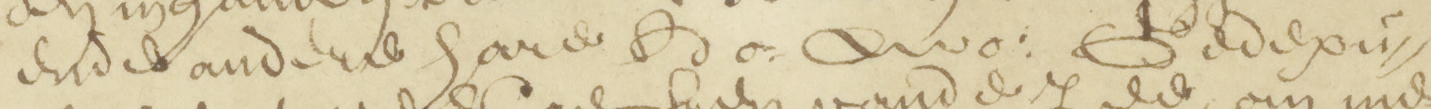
ende andere hare Ho:Mo: Gedepu„
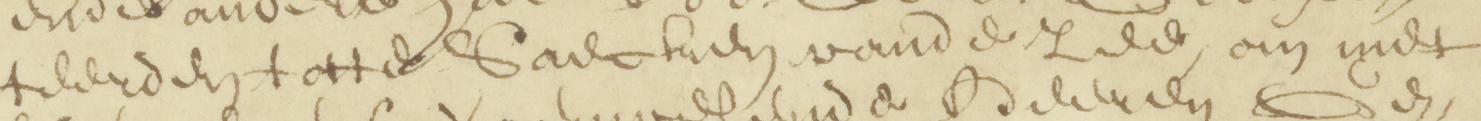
teerden totte Saecken vande Zee om met
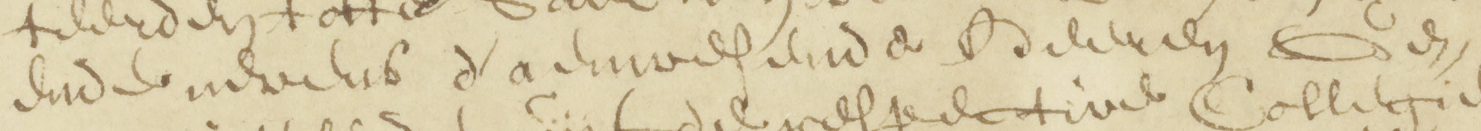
ende nevens d'aenwesende Heeren Ge„
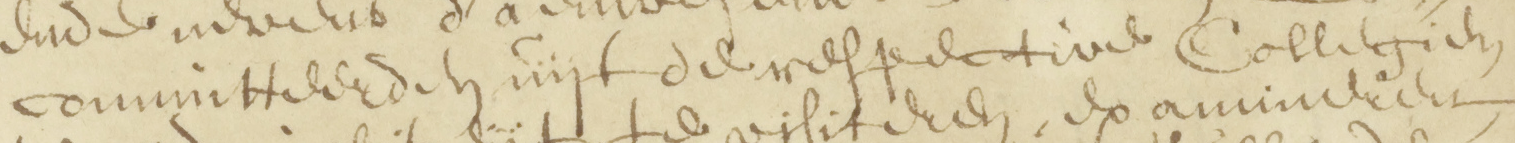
committeerden uijt de respective Collegien
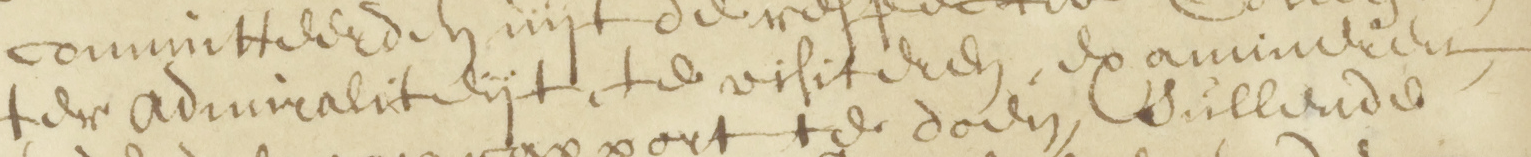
ter Admiraliteijt te visiteren, examineren,
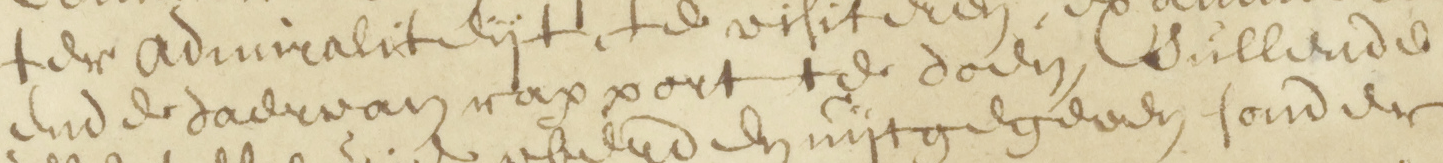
ende daervan rapport te doen, sullende
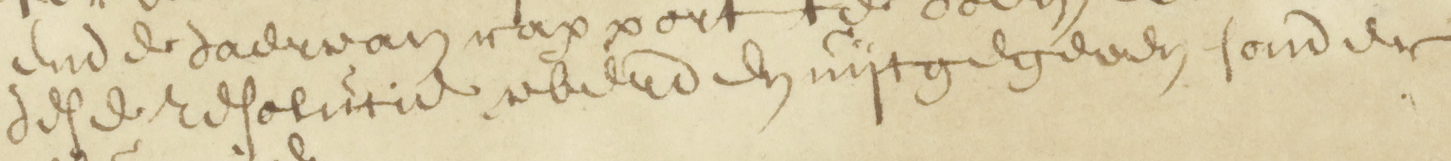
dese resolutie werden uijtgegeven, sonder
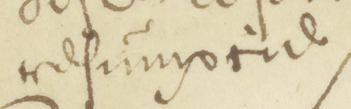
resumptie.
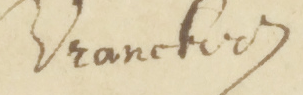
Vranckr
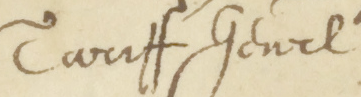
Tariff Genrl.
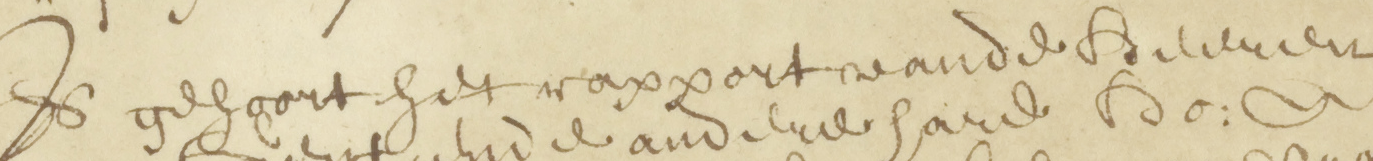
Is gehoort het rapport vande Heeren
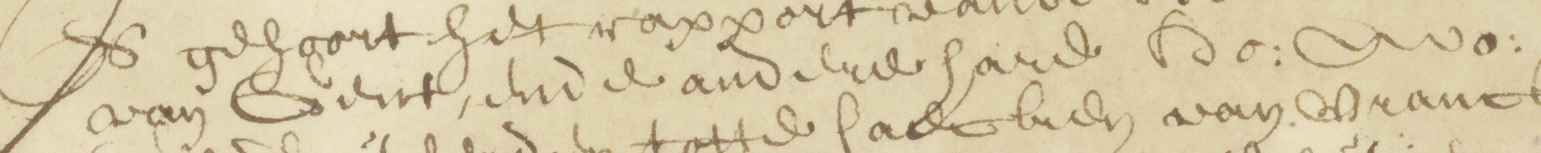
van Gent, ende andere hare Ho:Mo:
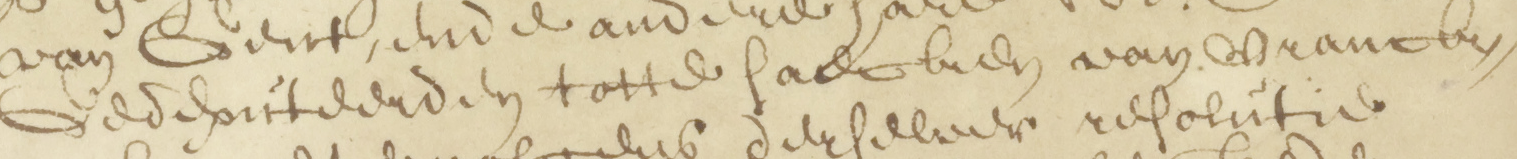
Gedeputeerden totte saecken van Vranck„
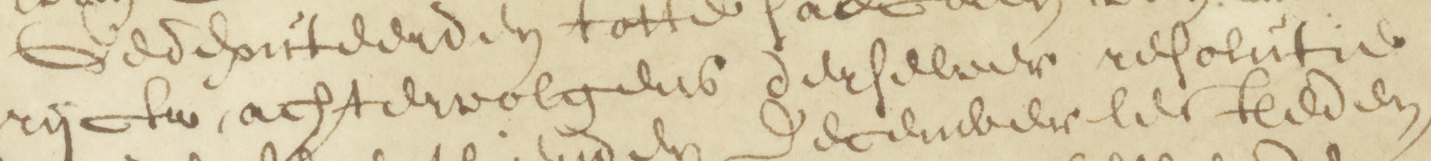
rijck, achtervolgens derselver resolutie
